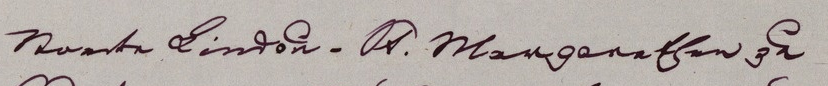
Strecke Lindau–St. Margarethen zu
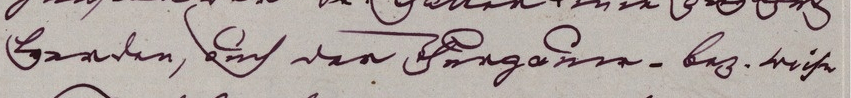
werden, auch der Thurgauer- bez.weise
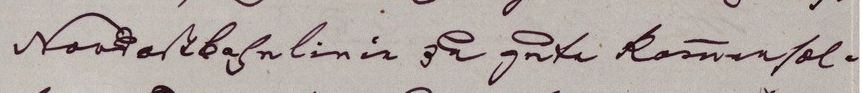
Nordostbahnlinie zu gute kommen sol-
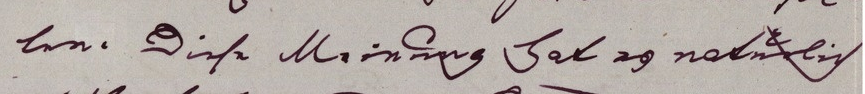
len. Diese Meinung hat es natürlich
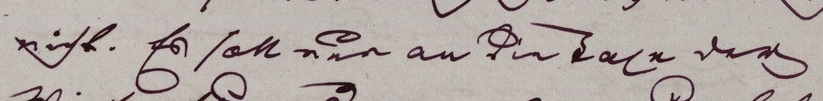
nicht. Es soll nur an die Taxe der
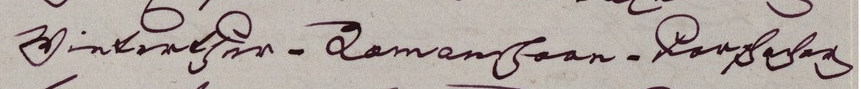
Winterthur–Romanshorn–Rorschacher
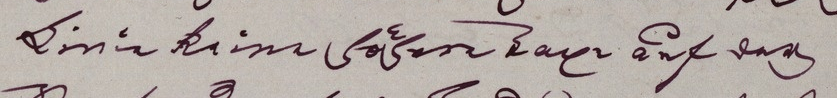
Linie keine höhere Taxe auf der
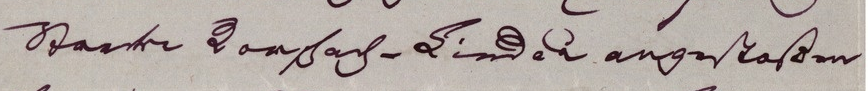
Strecke Rorschach–Lindau angestoßen
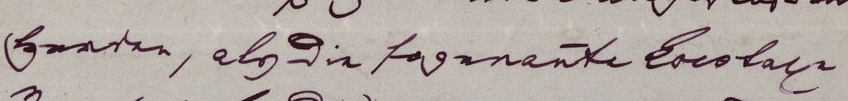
werden, als die sogenannte Locotaxe
